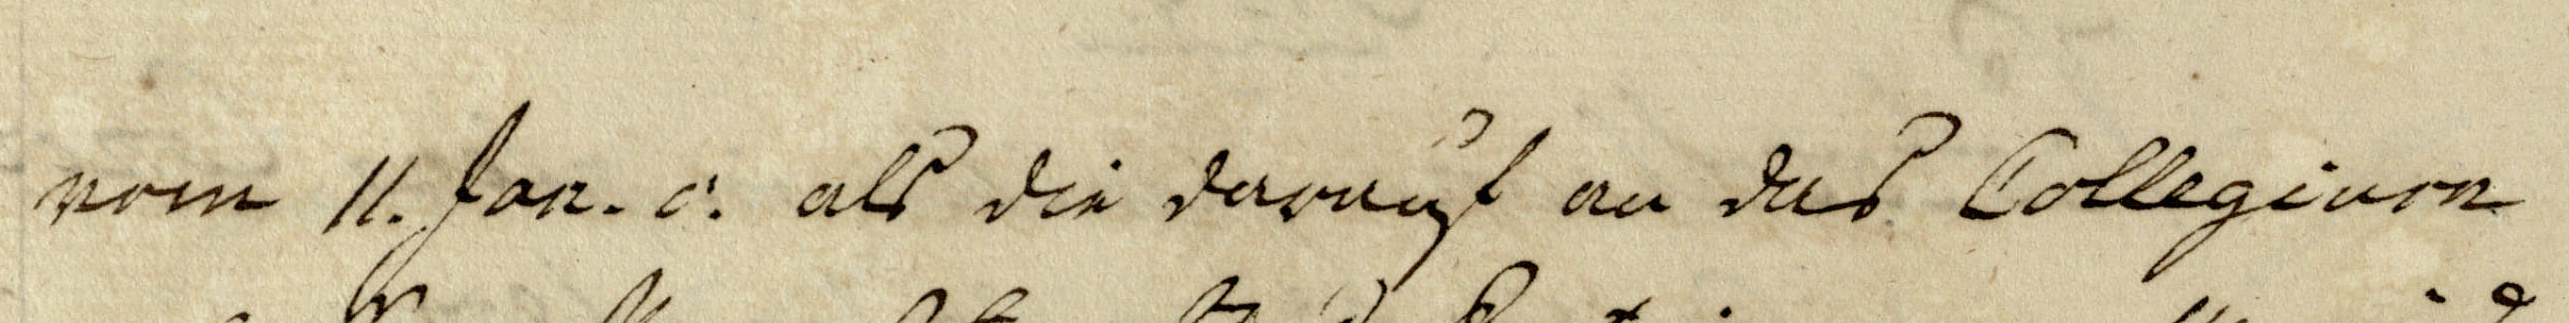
vom 11. Jan. c. als die darauf an das Collegium
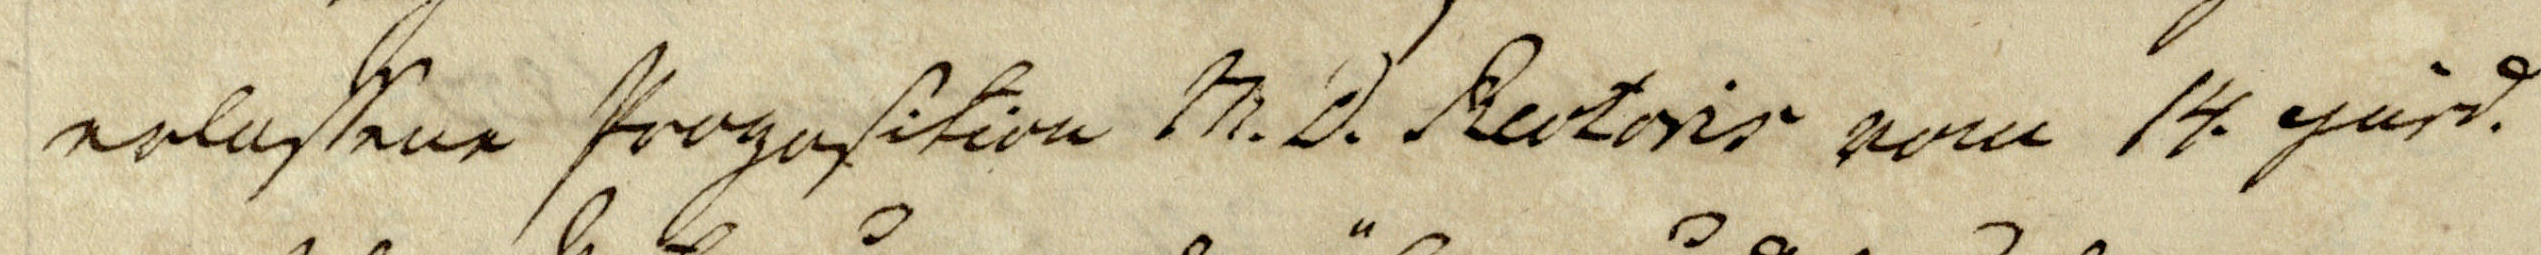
erlassene Proposition M. D. Rectoris vom 14. ejusd.
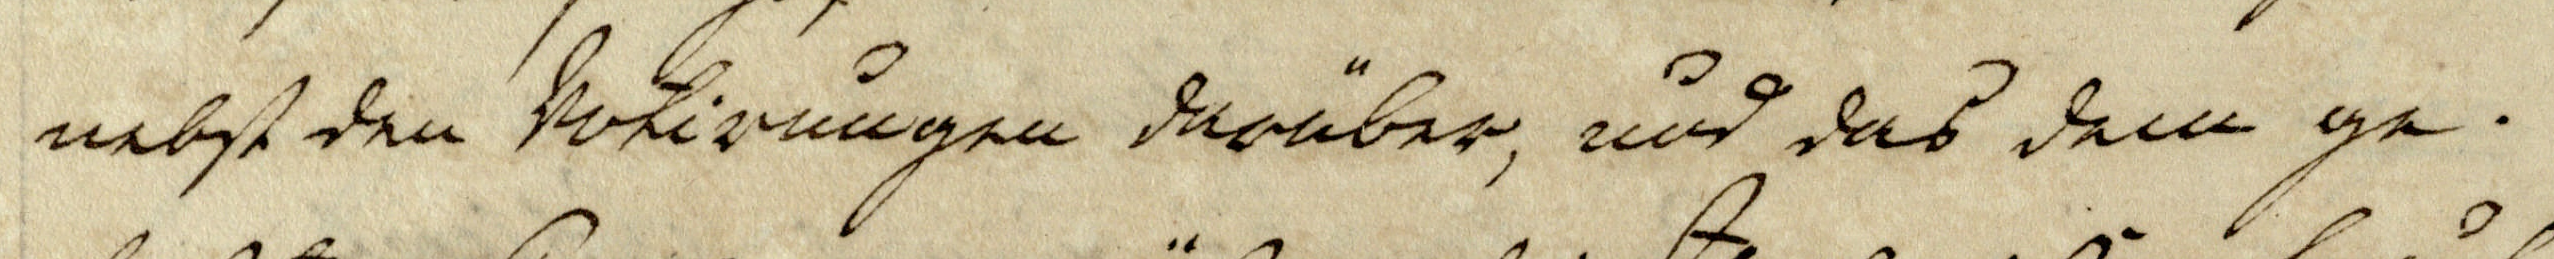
nebst den Votirungen darüber, und das dem ge¬
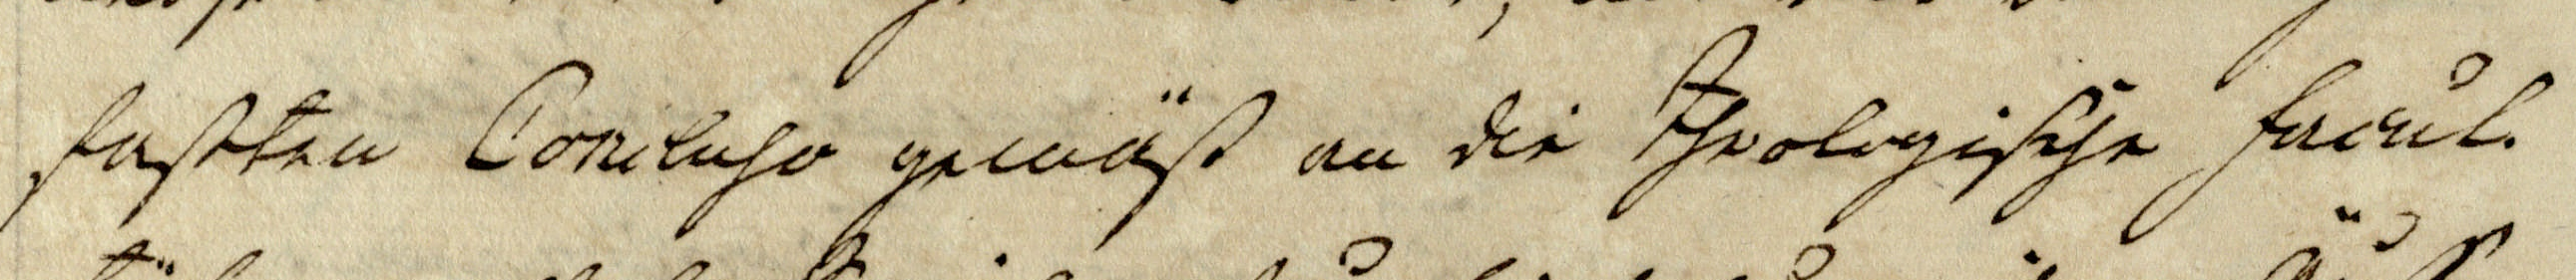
faßten Concluso gemäß an die Theologische Facul¬
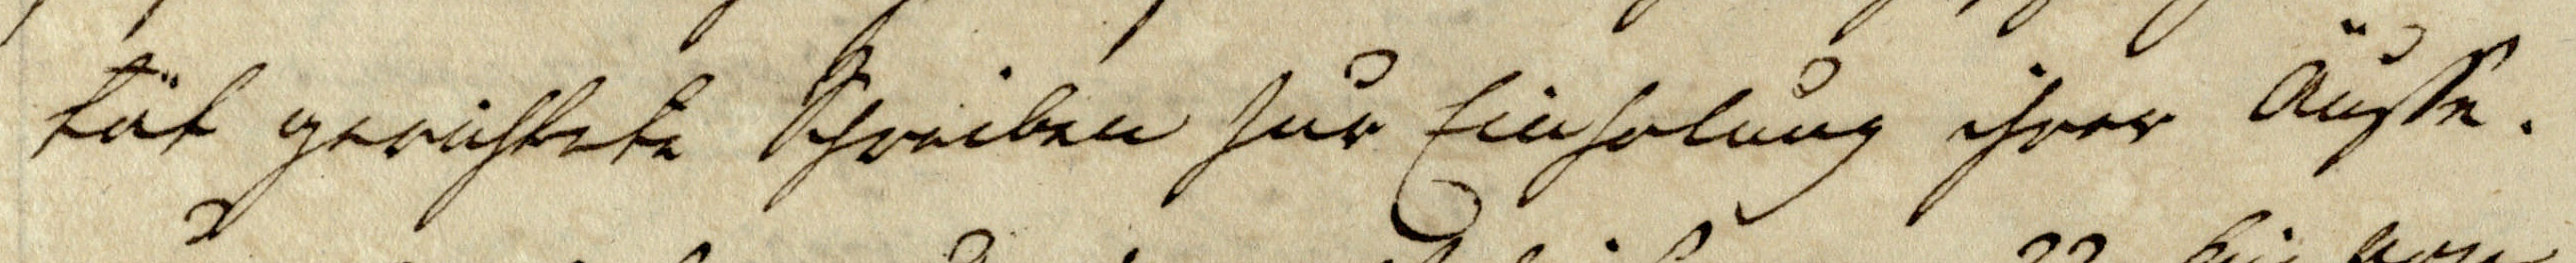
tät gerichtete Schreiben zur Einholung ihrer Äusse¬
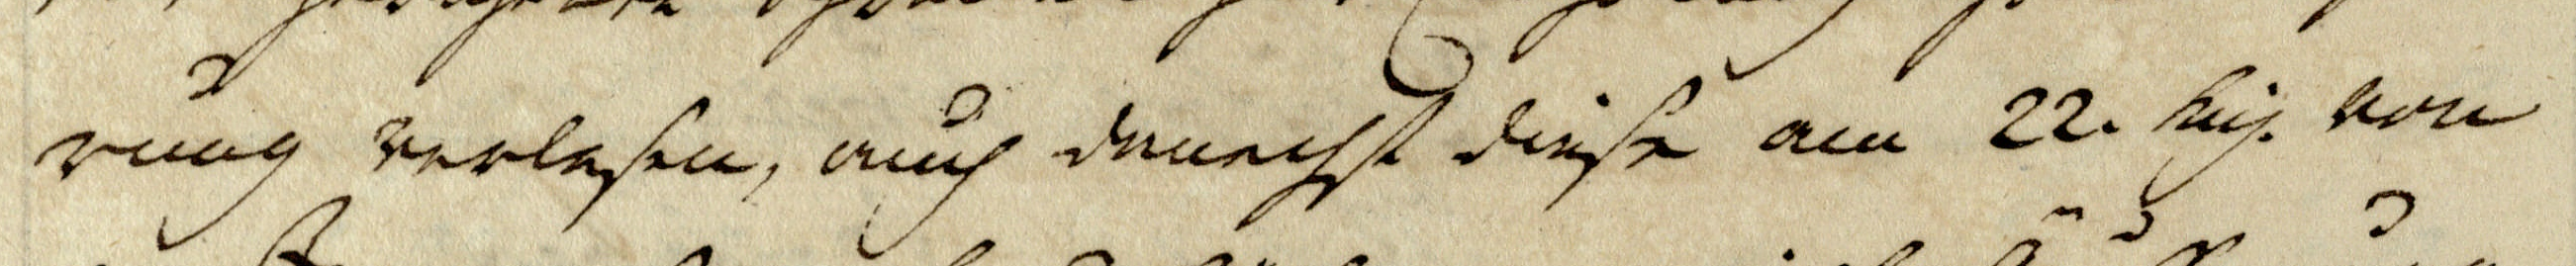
rung verlesen, auch danechst diese am 22. huj. von
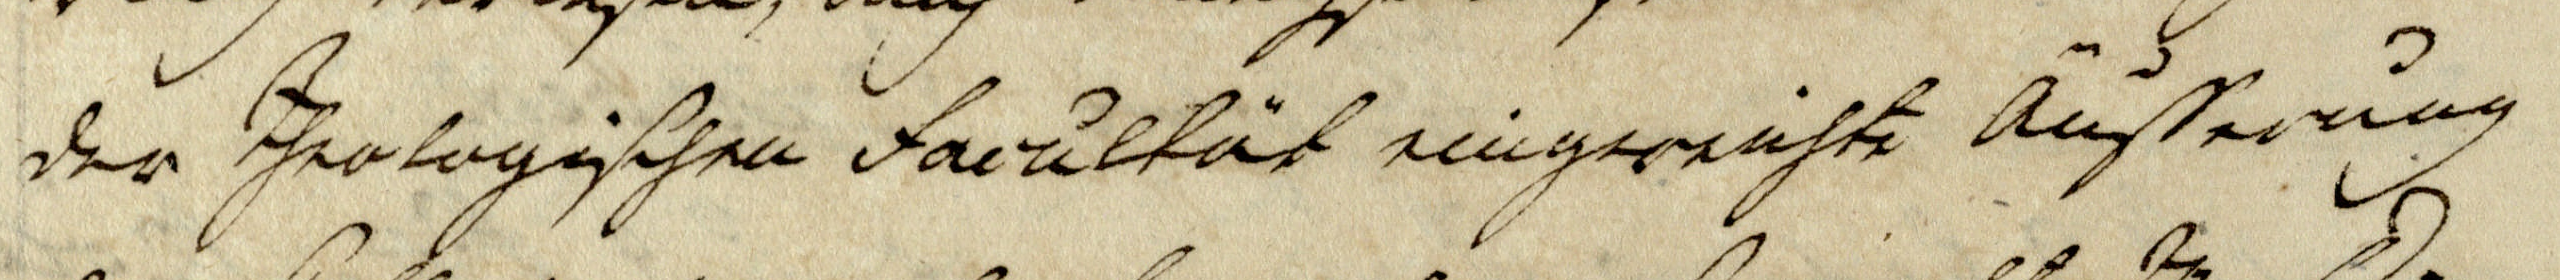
der Theologischen Facultät eingereichte Äusserung
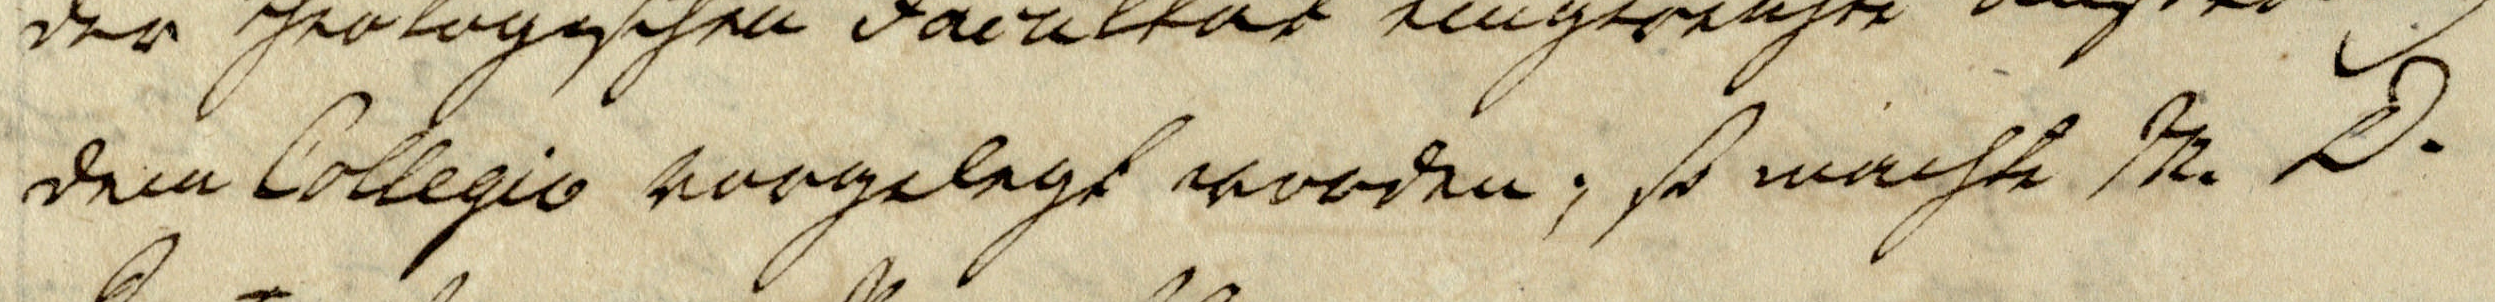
dem Collegio vorgelegt worden; so machte M. D.
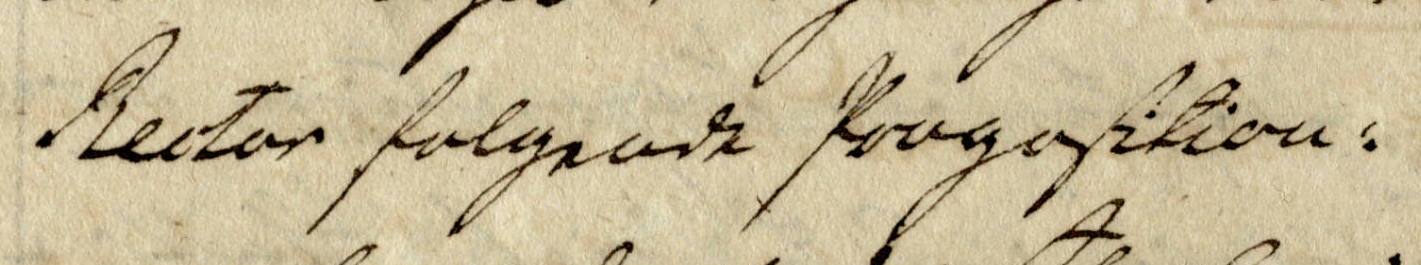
Rector folgende Proposition:
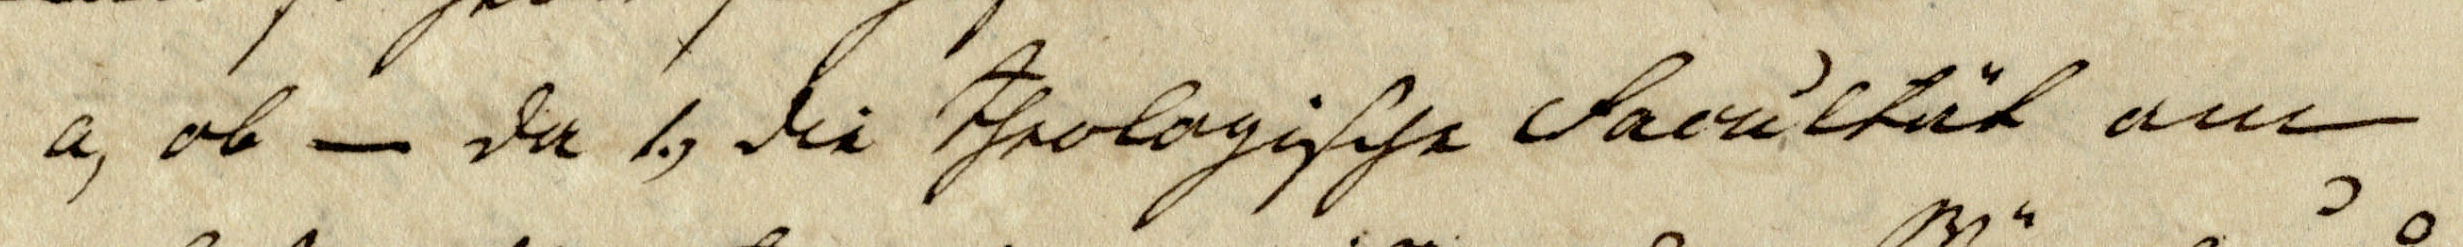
a, ob da 1., die Theologische Facultät am
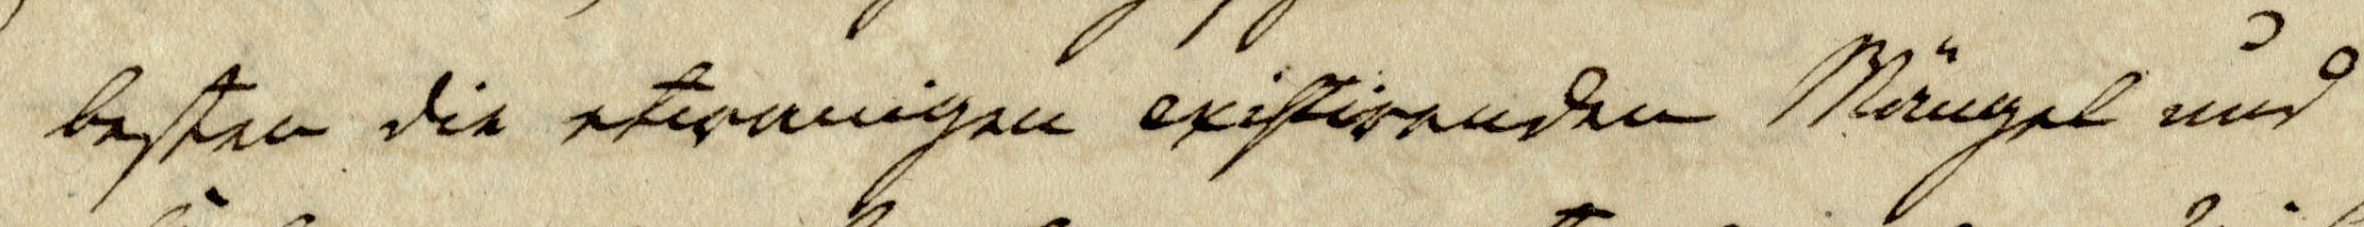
besten die etwanigen existirenden Mängel und
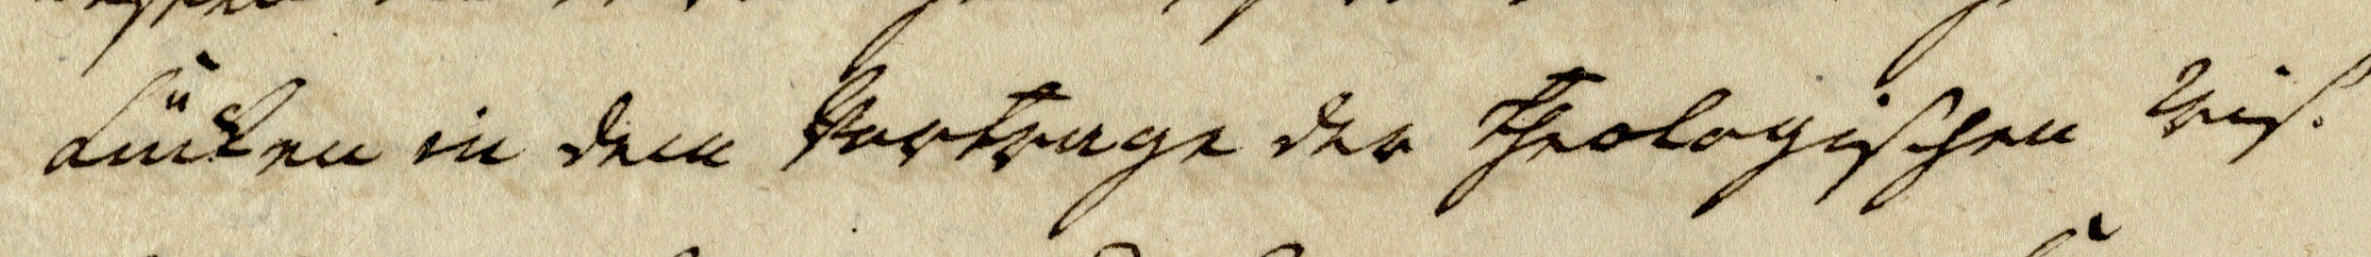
Lücken in dem Vortrage der Theologischen Wis¬
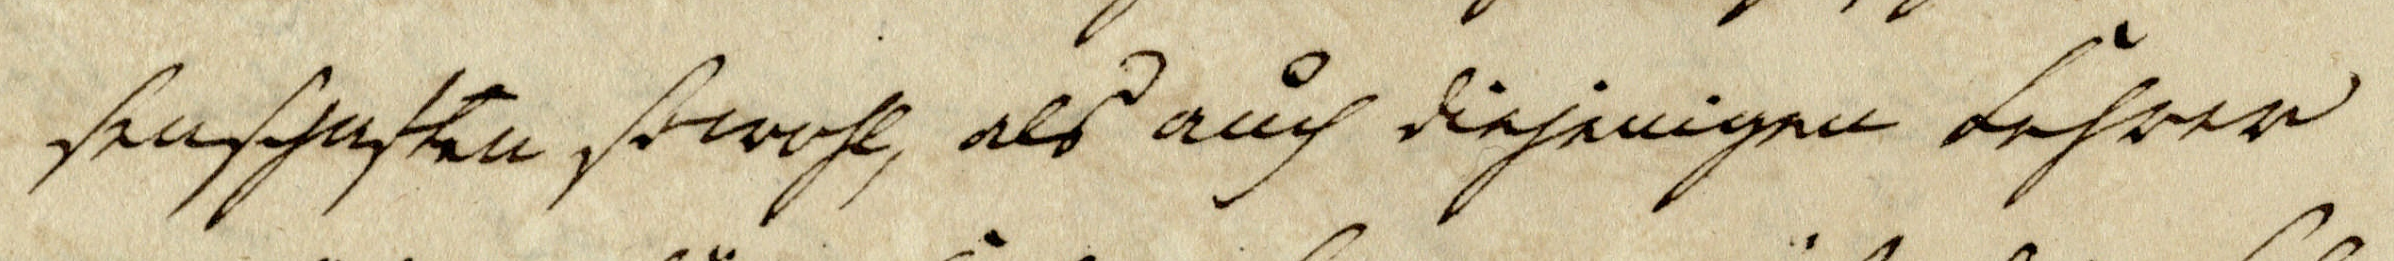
senschaften sowohl, als auch diejenigen Lehrer
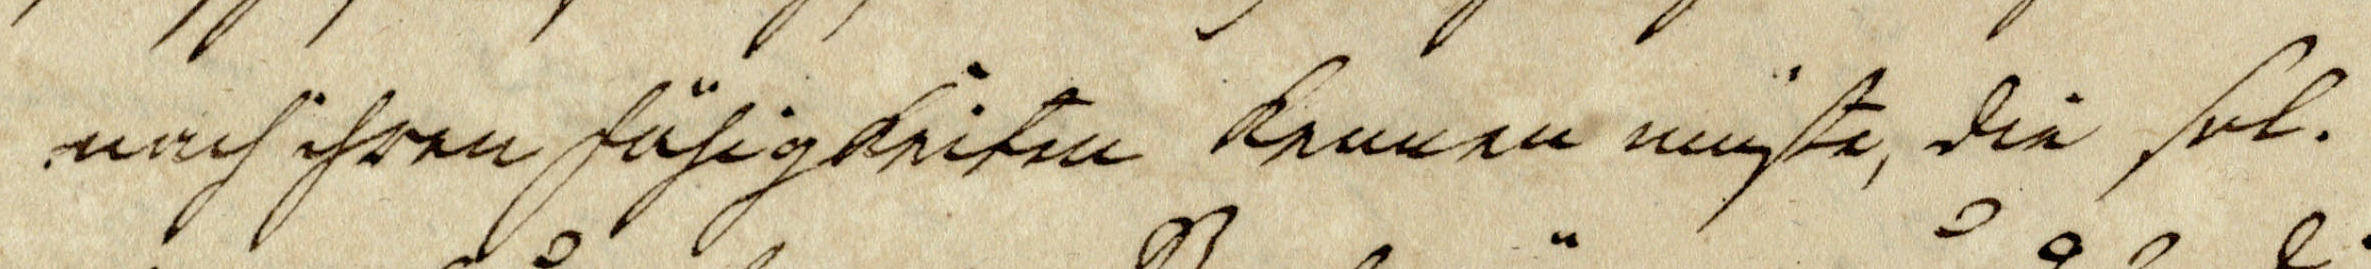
nach ihren Fähigkeiten kennen müßte, die sol¬
